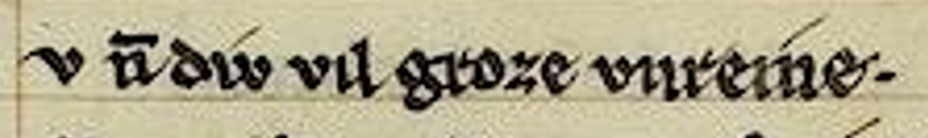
Vn(d) div vil groze vnreine.
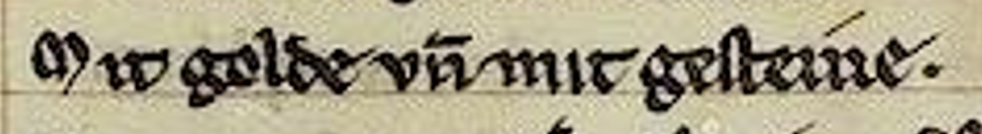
Mit golde vn(d) mit geſteine.
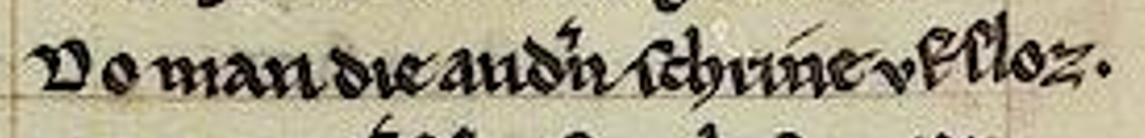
Do man die and(er)n ſchrine vfſloz.
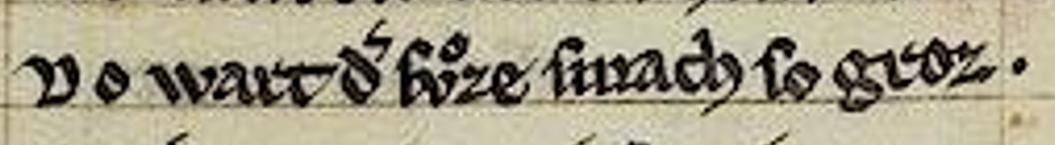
Do wart d(er) ſv°oze ſmach ſo groz.
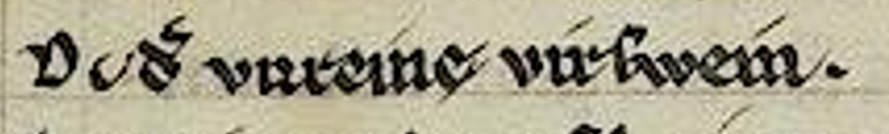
D(az) d(er) vnreine virſwein.
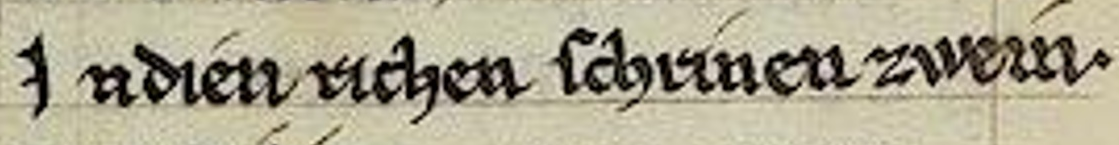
Indien richen ſchrinen zwein.
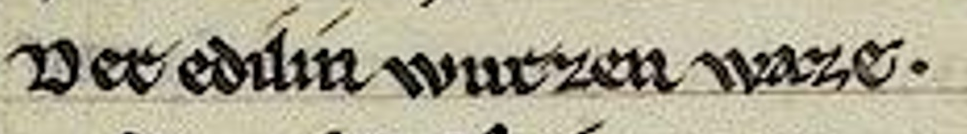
Der edilin wurzen waze.
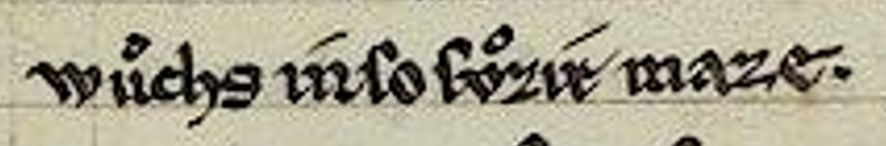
Wu°ochs inſo ſv°ozir maze.
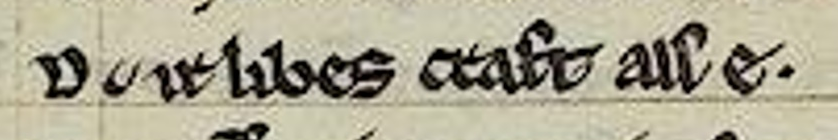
D(az) ir libes craft alſ e.
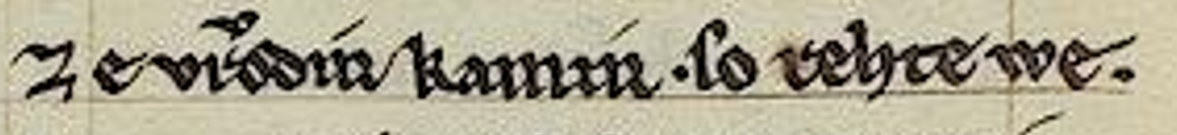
Ze vr°vodin kamin. ſo rehte we.
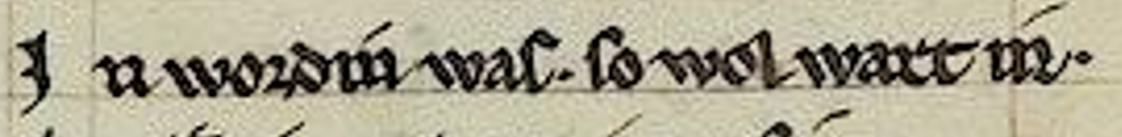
In wordin was. ſo wol wart in.
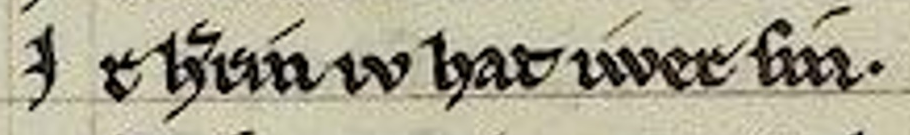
Ir h(er)rin iv hat iwer ſin.
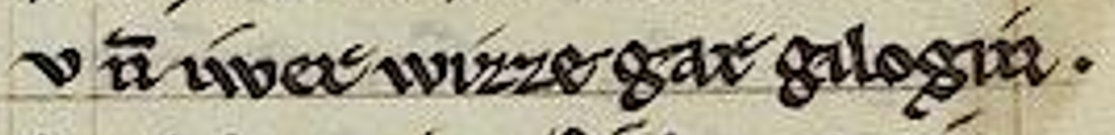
Vn(d) iwer wizze gar gilogin.
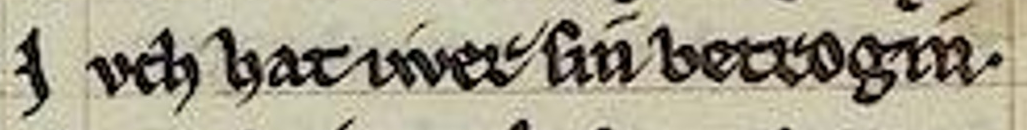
Ivch hat iwer ſin betrogin.
